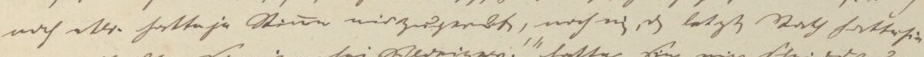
noch etw. hatte jene Stimme mir zugerufen, noch einen, den letzten Rath hatte sie
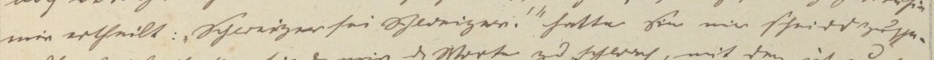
mir ertheilt: «Schweizer sei Schweizer!» hatte sie mir scheidd zuge-
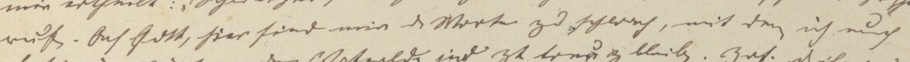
rufen. Ach Gott, hier sind mir die Worte zu schwach, mit denen ich euch
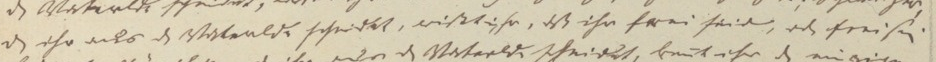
die ihr aus dem Vaterlde scheidet, wißt ihr, dß ihr frei seid, oder frei sein
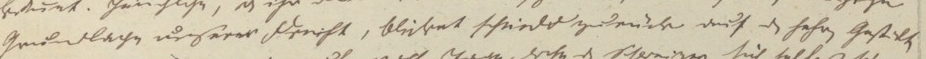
Grundlage unserer Freiht, blicket scheidd zurück auf die hehren Gestalten
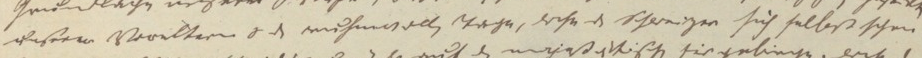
unserer Voreltern & die ruhmvollen Tage, wche die Schweizer sich selbst schon
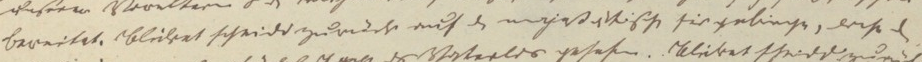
bereitet. Blicket scheidd zurück auf die majestätischen Eisgebirge, wche die
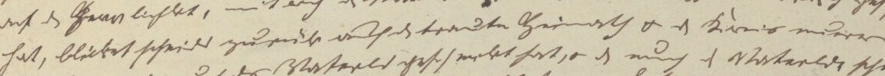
hat, blicket scheidd zurück auf die traute Heimath & den Kreis euerer
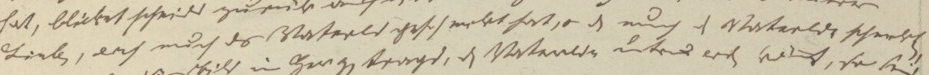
Lieben, wch euch ds Vaterland geschenkt hat, & die euch dem Vaterlande schenkten,
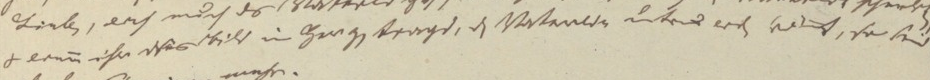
& wenn ihr dses Bild im Herzen tragd, dem Vaterlde untreu wden könnt, so seid
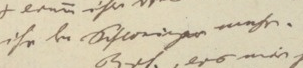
ihr keine Schweizer mehr.
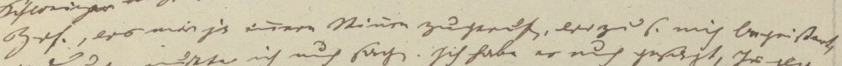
Zof., ws mir jene innere Stimme zugerufen, wozu s. mich begeistert,
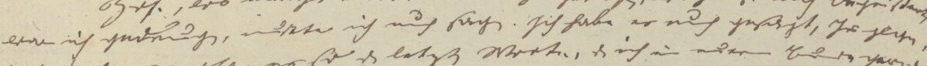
war ich gedrungen, mußte ich euch sagen. Ich habe es euch gesagt, Jünglinge,
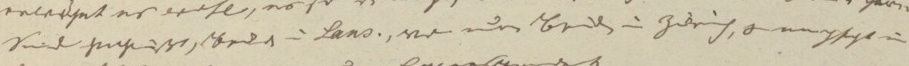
Seid gegrüßt, Brüder in Laus., von euren Brüdern in Zürich, & empfgt ein
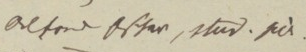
Alfred Escher, stud. iur.
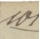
durch
